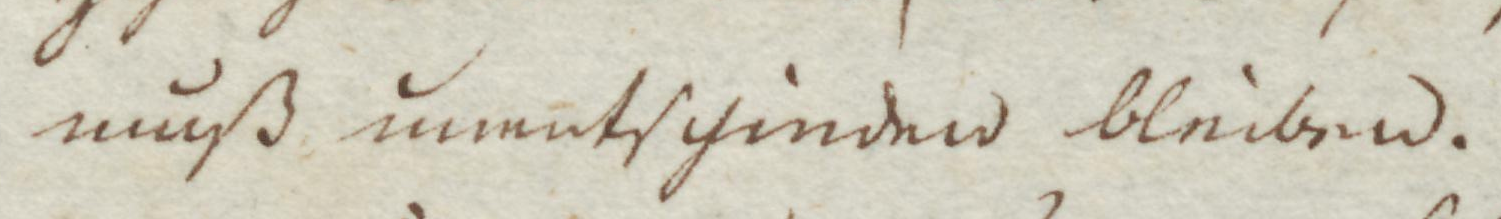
muß unentschieden bleiben.
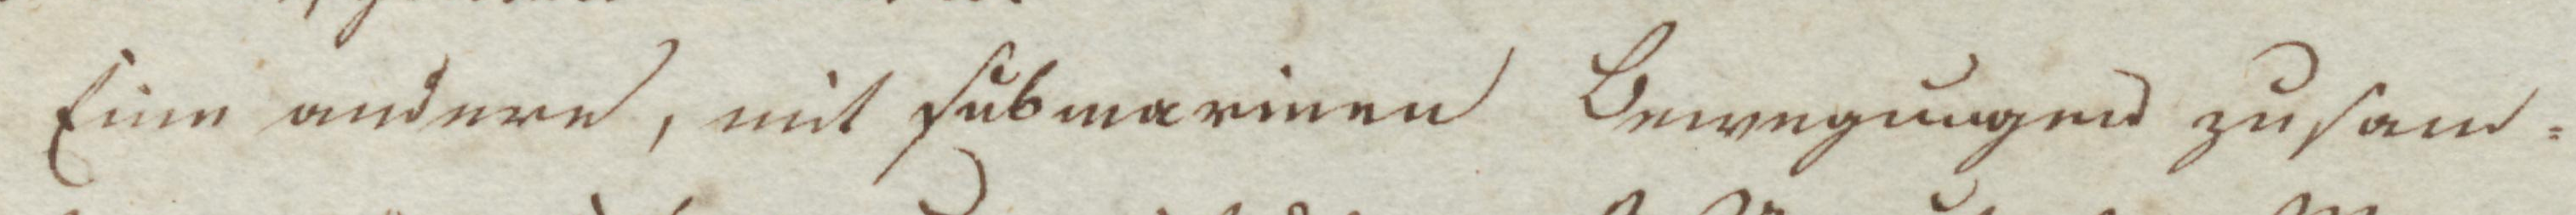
Eine andere, mit submarinen Bewegungen zusam-
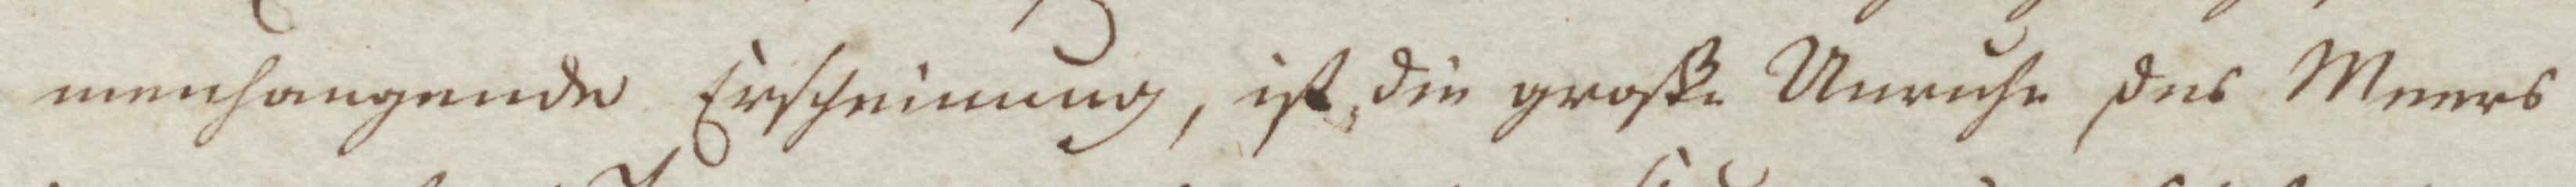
menhangende Erscheinung, ist die große Unruhe des Meeres
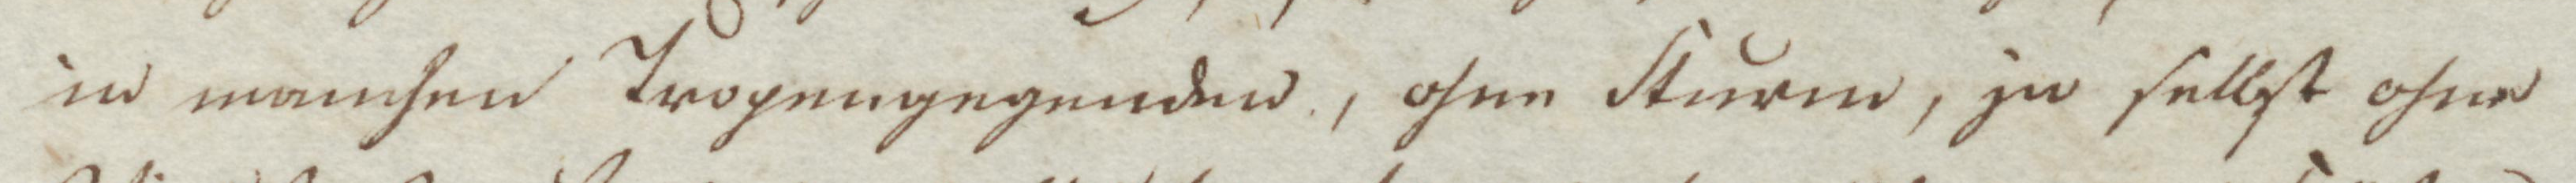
in manchen Tropengegenden, ohne Sturm, ja selbst ohne
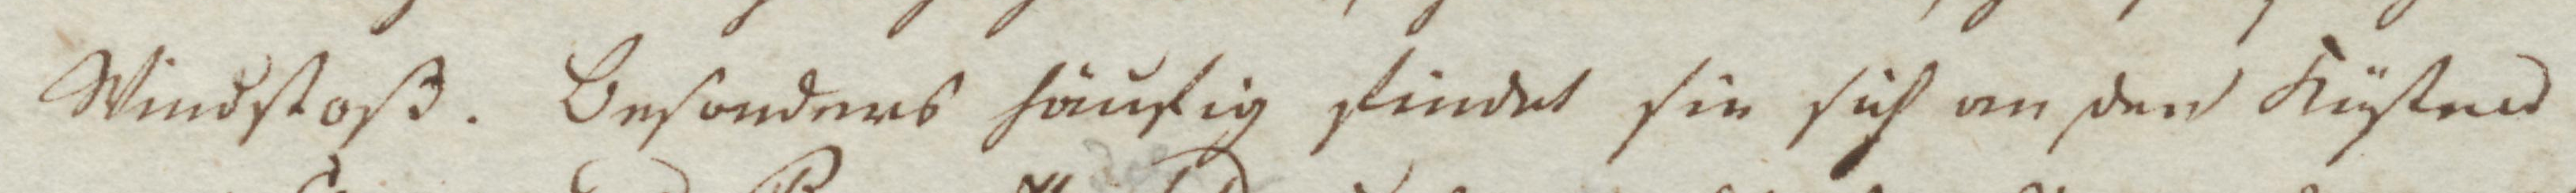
Windstoß. Besonders häufig findet sie sich an den Küsten
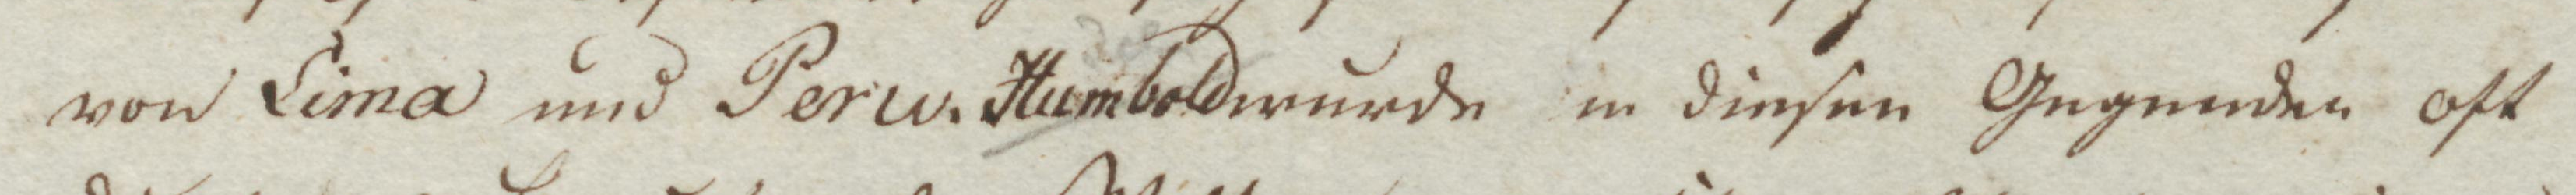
von Lima und Peru. HumboldIch wurde in diesen Gegenden oft
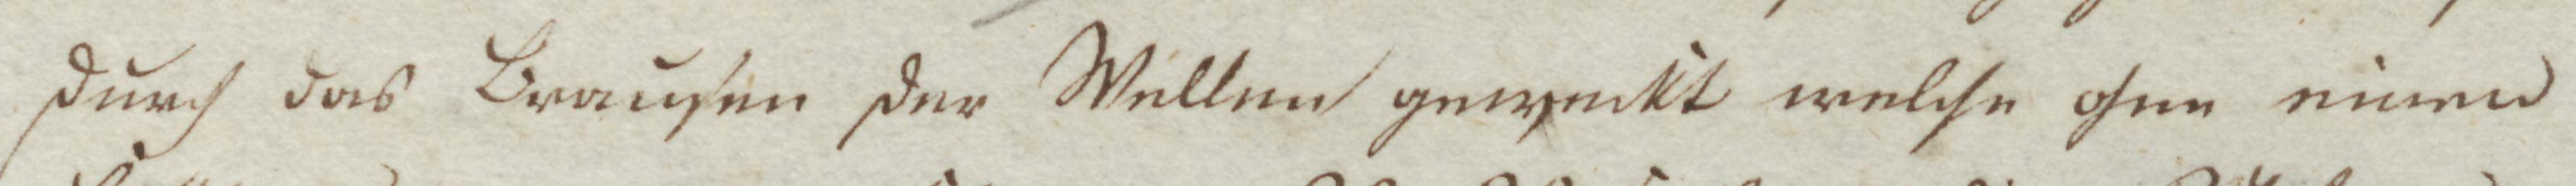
durch das Brausen der Wellen geweckt welche ohne einen
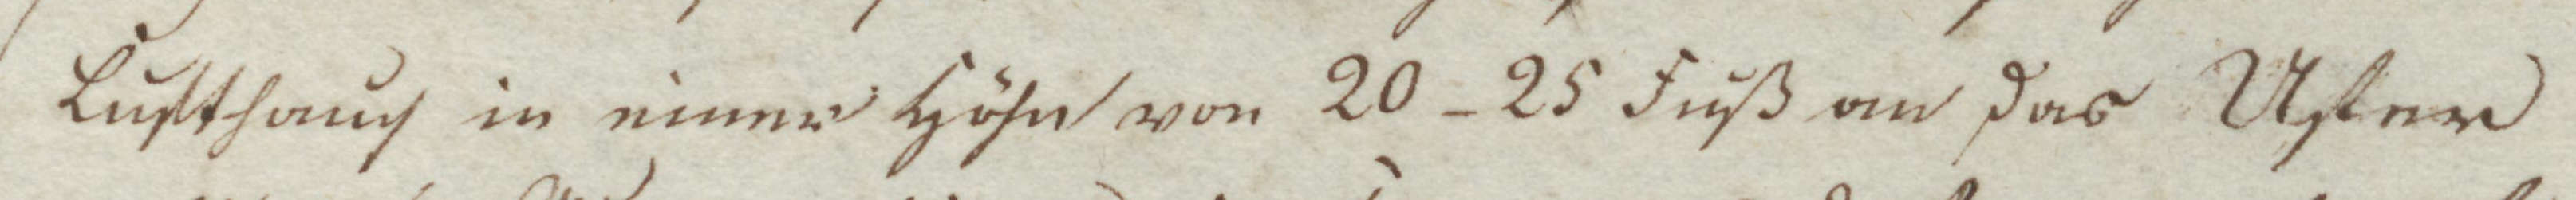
Lufthauch in einer Höhe von 20–25 Fuß an das Ufer
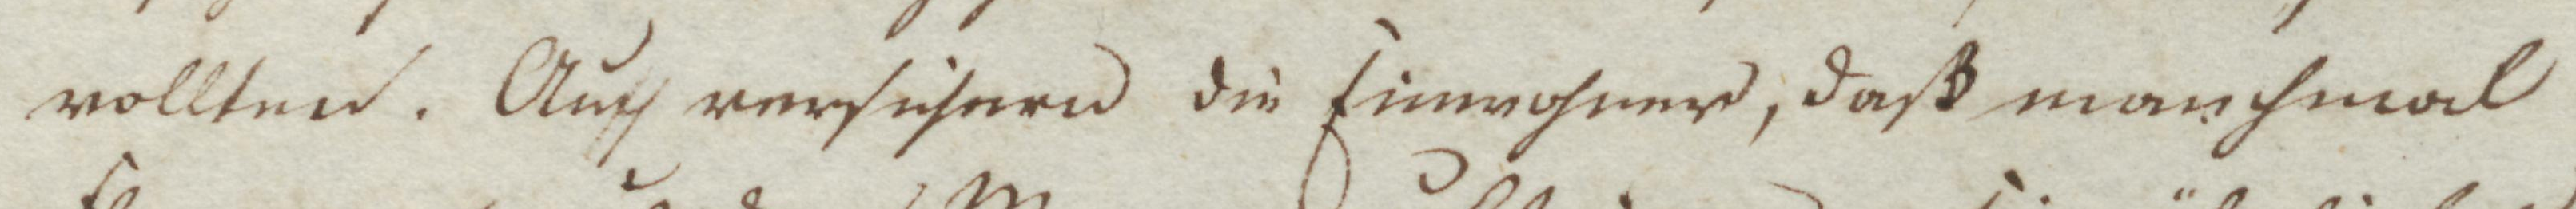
rollten. Auch versichern die Einwohner, daß manchmal
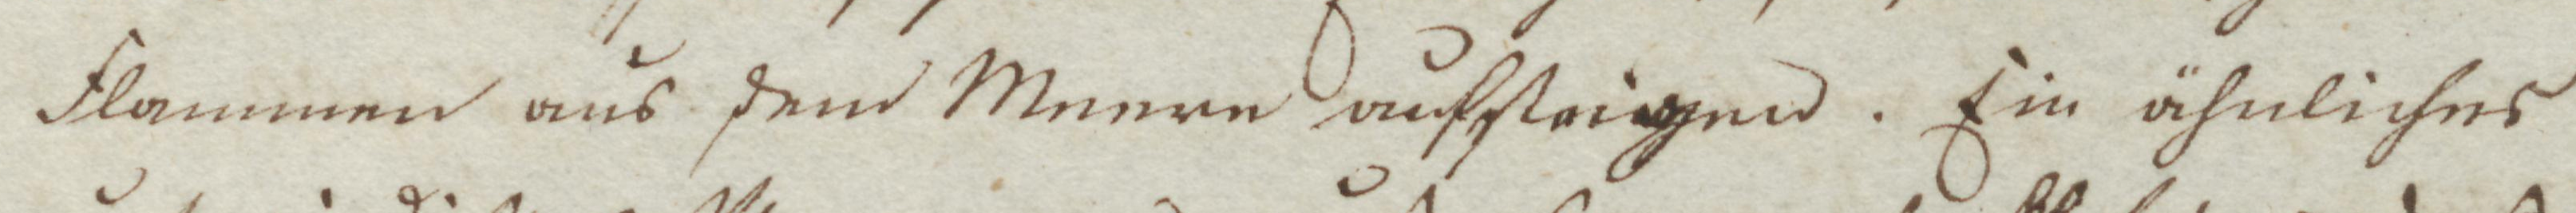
Flammen aus dem Meere aufsteigen. Ein ähnliches
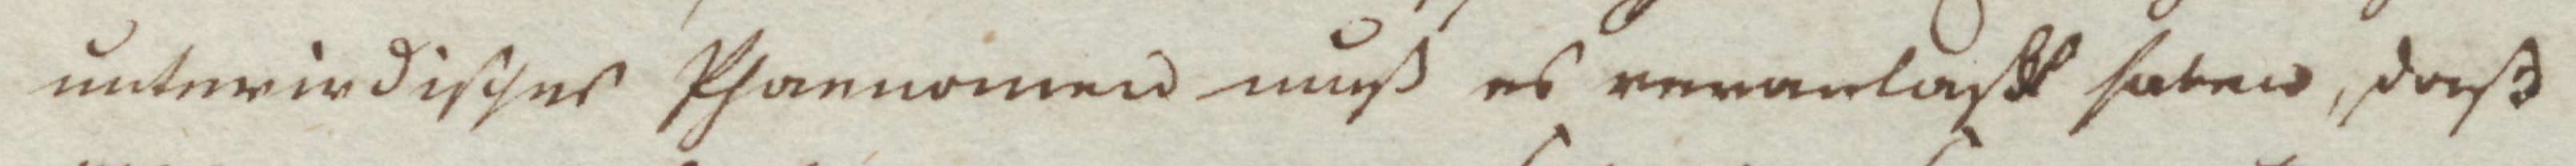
unterirdisches Phaenomen muß es veranlaßt haben, daß
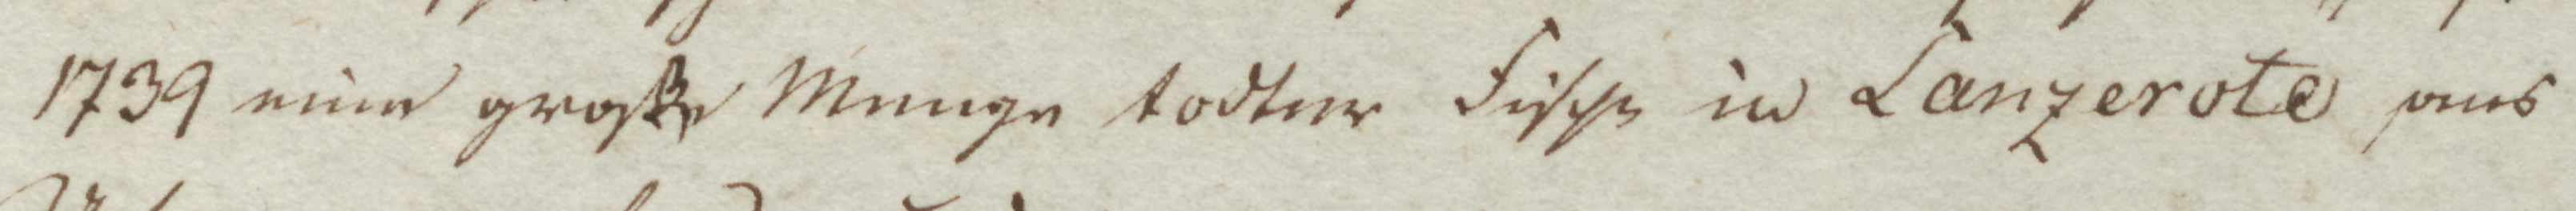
1739 eine große Menge todter Fische in Lanzerote ans
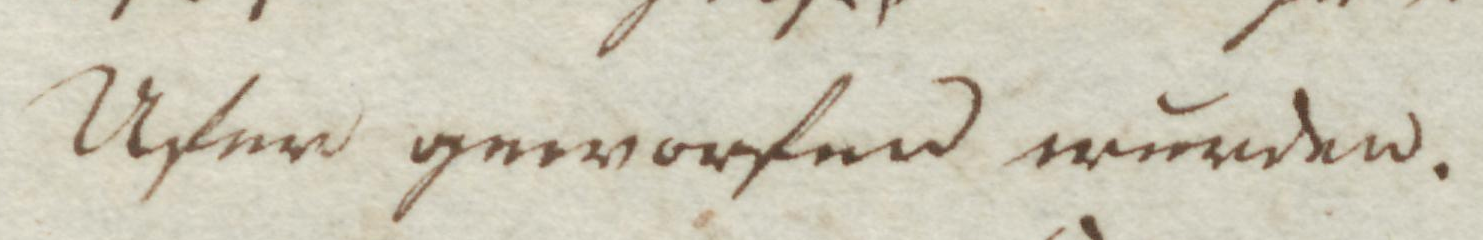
Ufer geworfen wurden.
